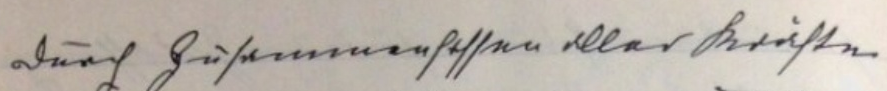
Durch Zusammenfassen aller Kräfte
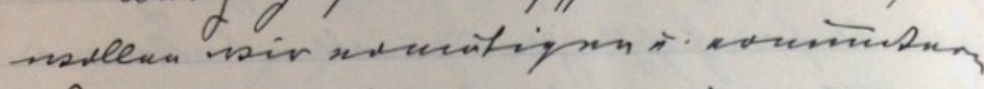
wollen wir ermutigen u. ermuntern
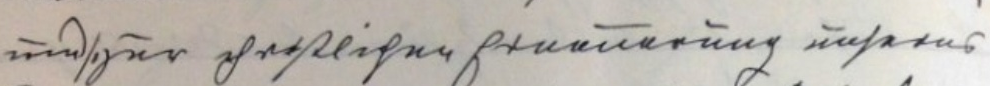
um zur christlichen Erneuerung unseres
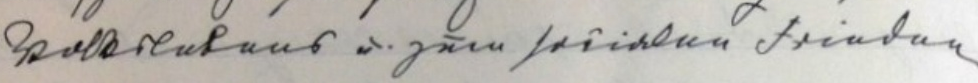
Volkslebens u. zum soîialen Frieden
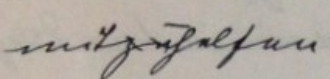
mitzuhalten.
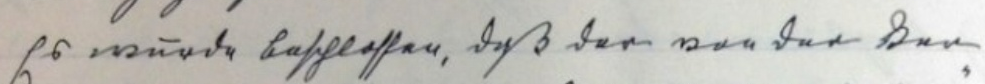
Es wurde beschlossen, daß der von der
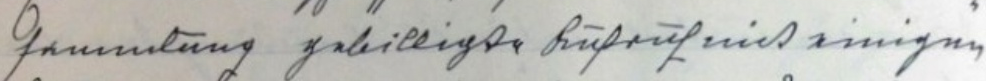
Versammlung gebilligte Aufruf mit einigen
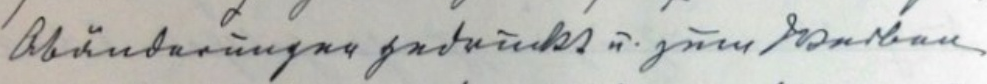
Abänderungen gedruckt zum Werben
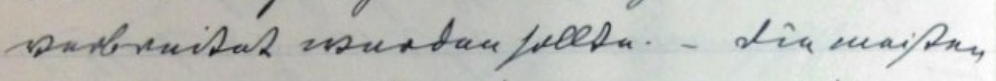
verbreitet werden sollte. Die meisten
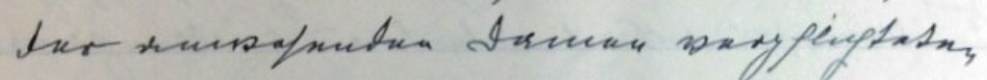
der anwesenden Damen verpflichteten
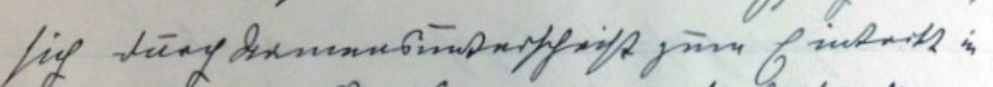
sich durch Namensunterschrift zum Eintritt in
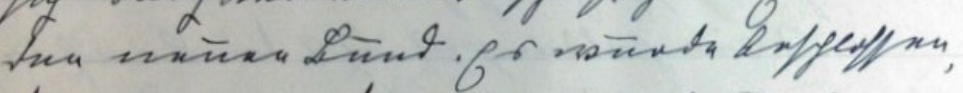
den neuen Bund. Es wurde beschlossen,
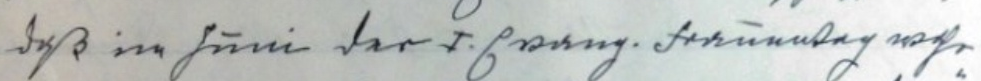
daß im Juni der I. Evang. Frauentag wahr
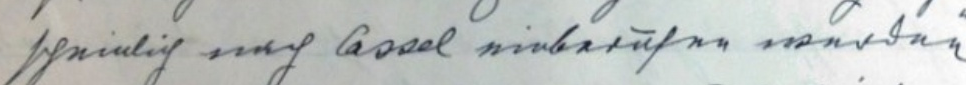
wahrscheinlich nach Cassel einberufen werden
